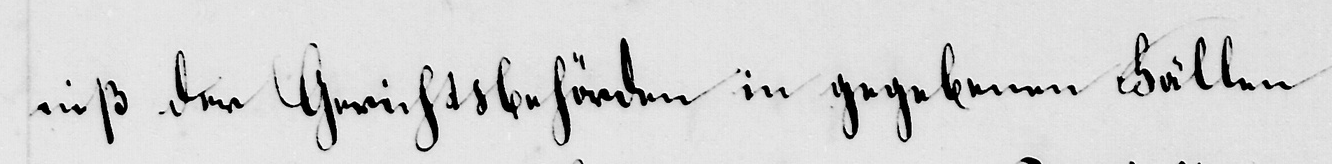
niß der Gerichtsbehörden in gegebenen Fällen
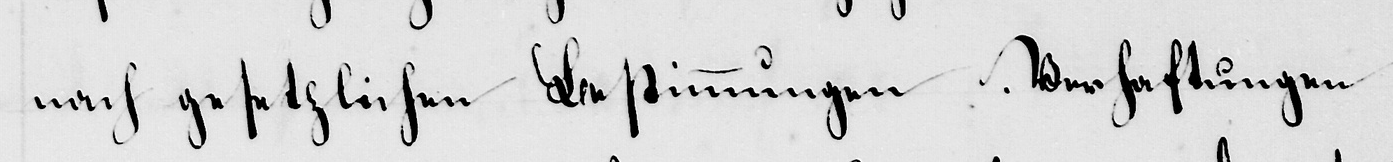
nach gesetzlichen Bestimmungen Verhaftungen
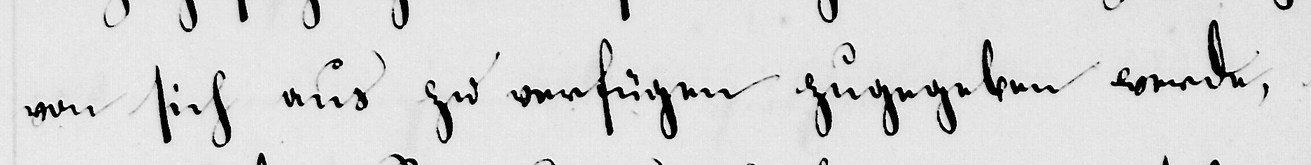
von sich aus zu verfügen zugegeben werde,
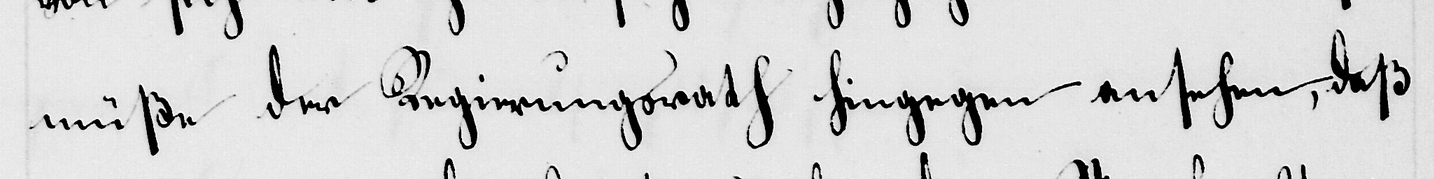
müße der Regierungsrath hingegen ansehen, daß
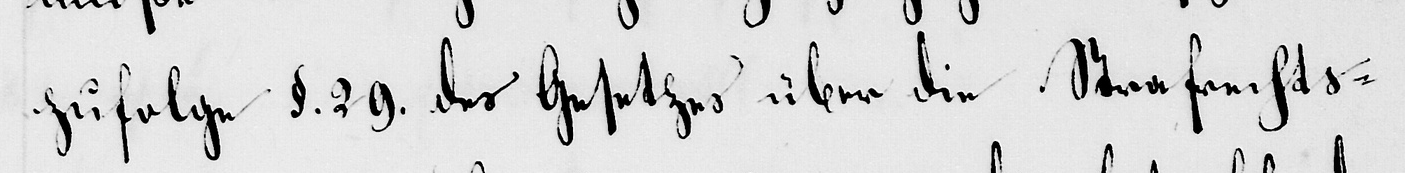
zufolge §. 29. des Gesetzes über die Strafrechts¬
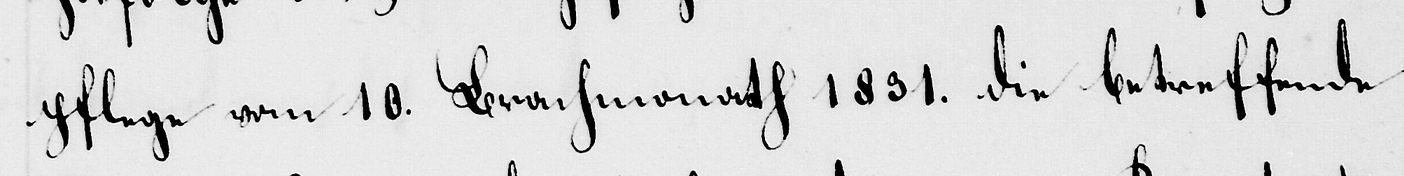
pflege vom 10. Brachmonath 1831. die betreffende
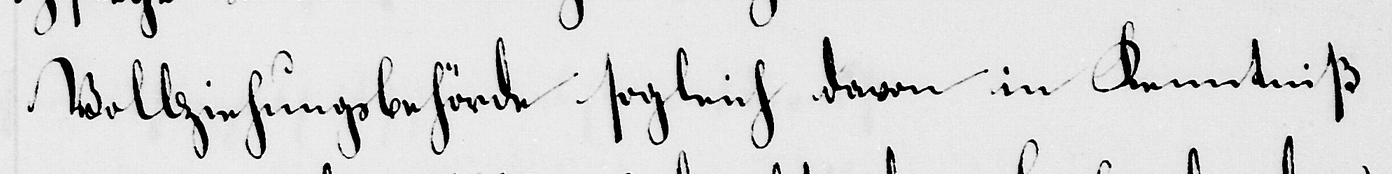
Vollziehungsbehörde sogleich davon in Kenntniß
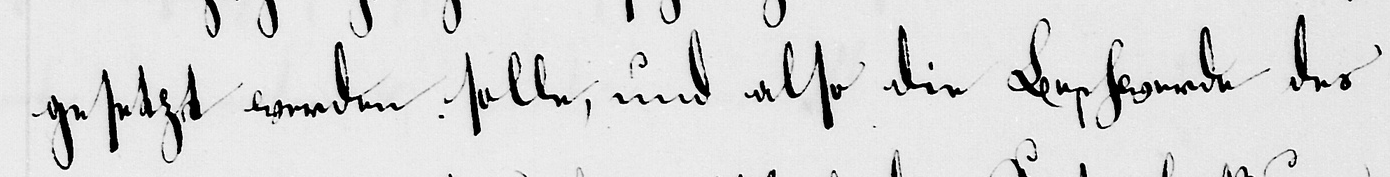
gesetzt werden solle, und also die Beschwerde des
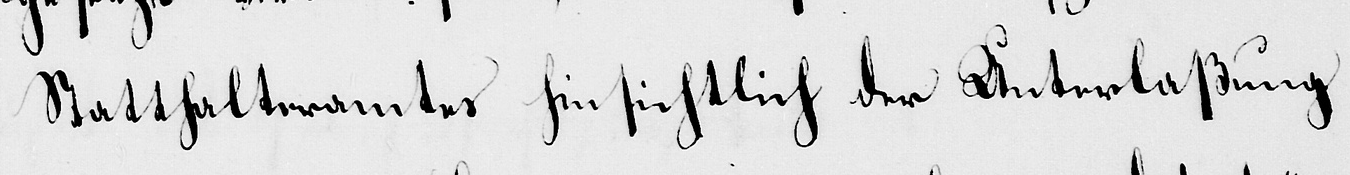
Statthalteramtes hinsichtlich der Unterlaßung
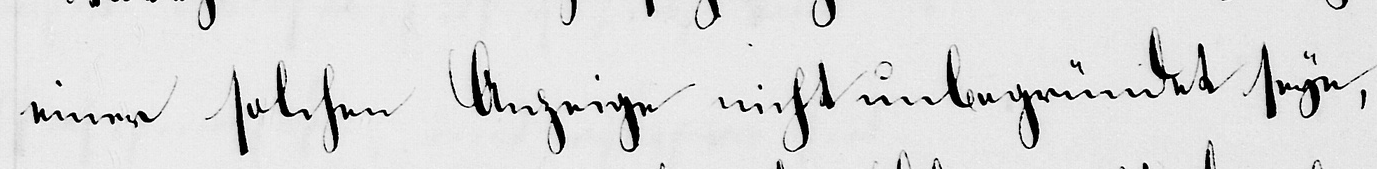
einer solchen Anzeige nicht unbegründet seye,
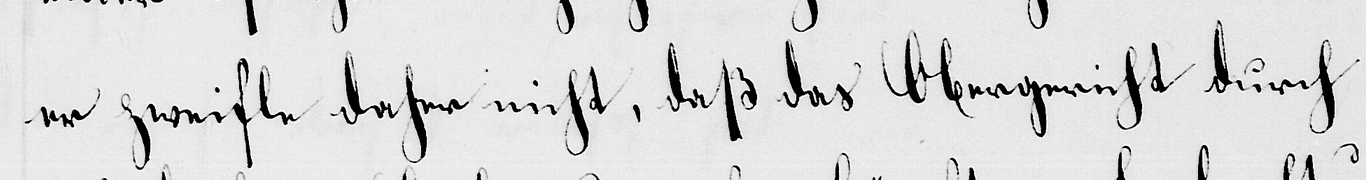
er zweifle daher nicht, daß das Obergericht durch
